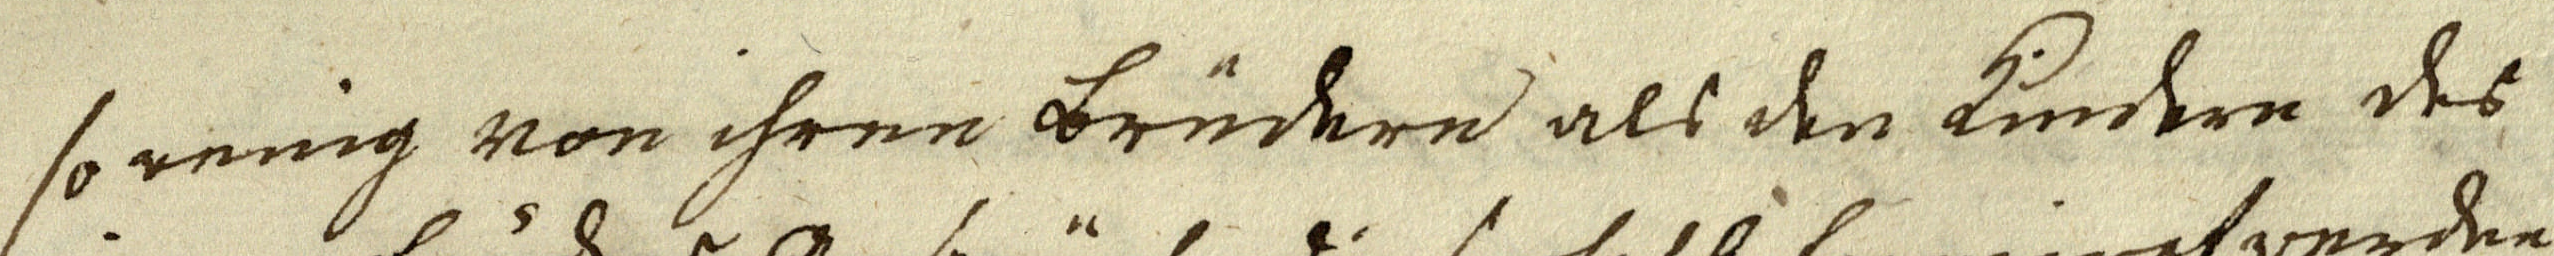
so wenig von ihren Brüdern als den Kindern des
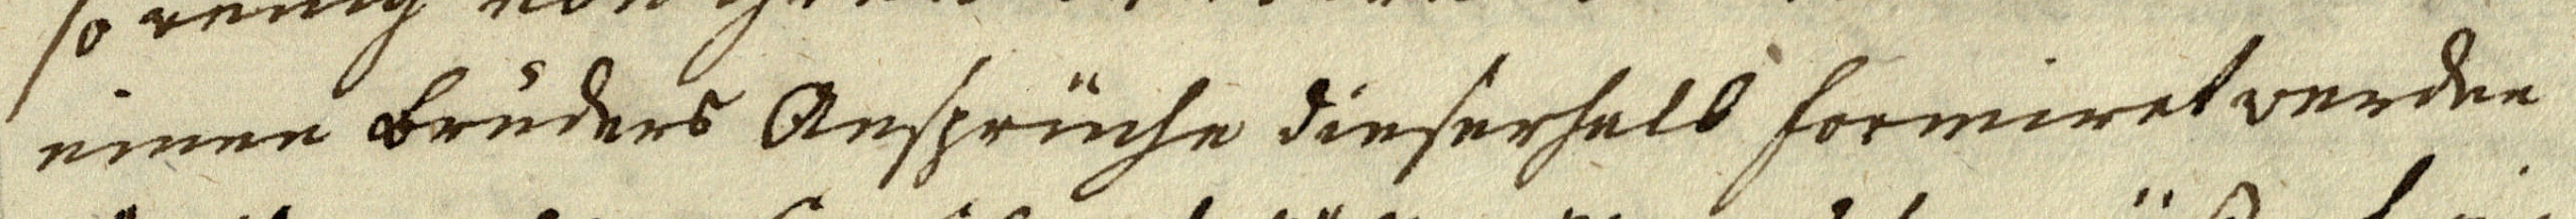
einen Bruders Ansprüche dieserhalb formiret werden
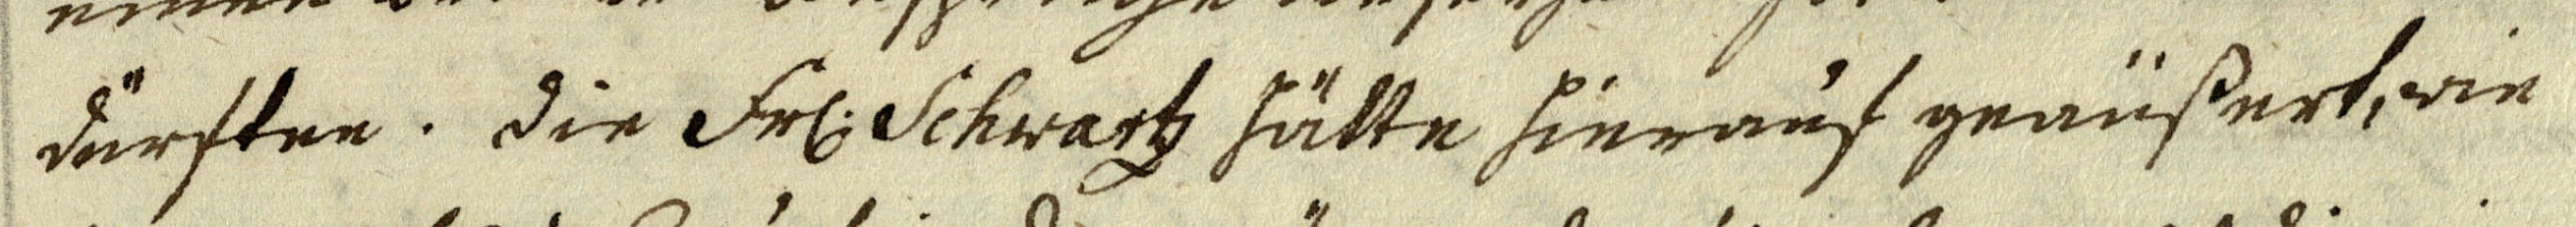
dürften. Die Frl. Schwartz hätte hierauf geäußert, wie
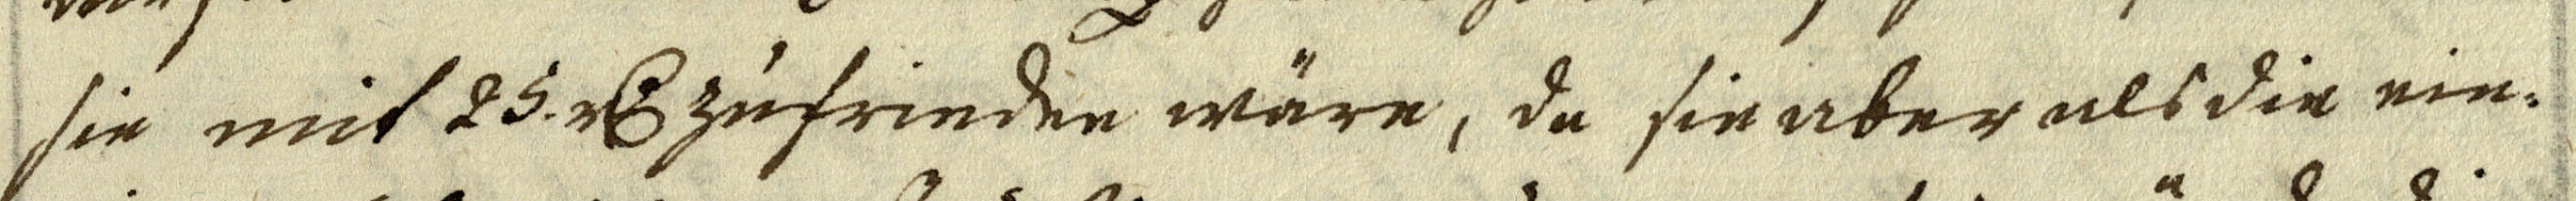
sie mit 25 rt. zufrieden wäre, da sie aber als die ein¬
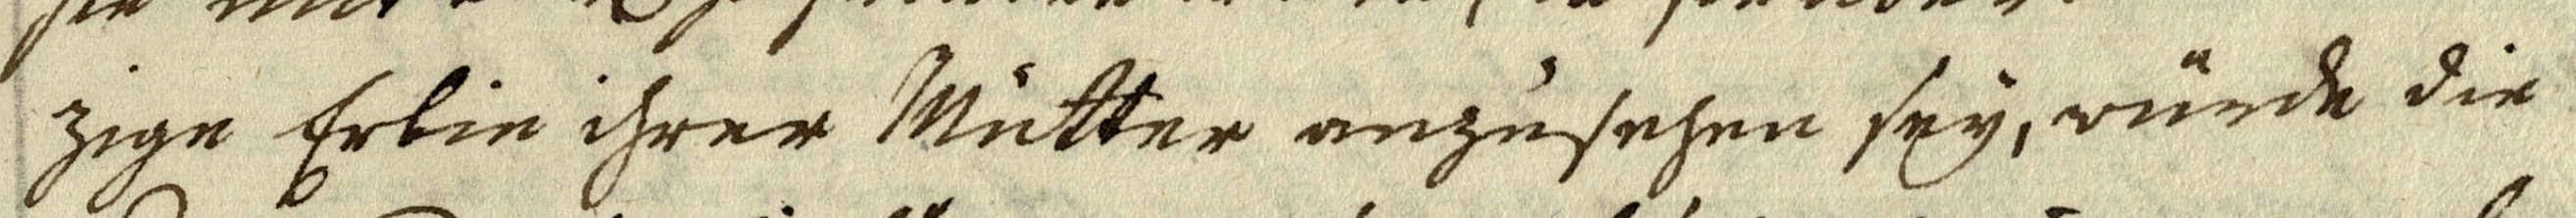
zige Erbin ihrer Mutter anzusehen seÿ, würde die
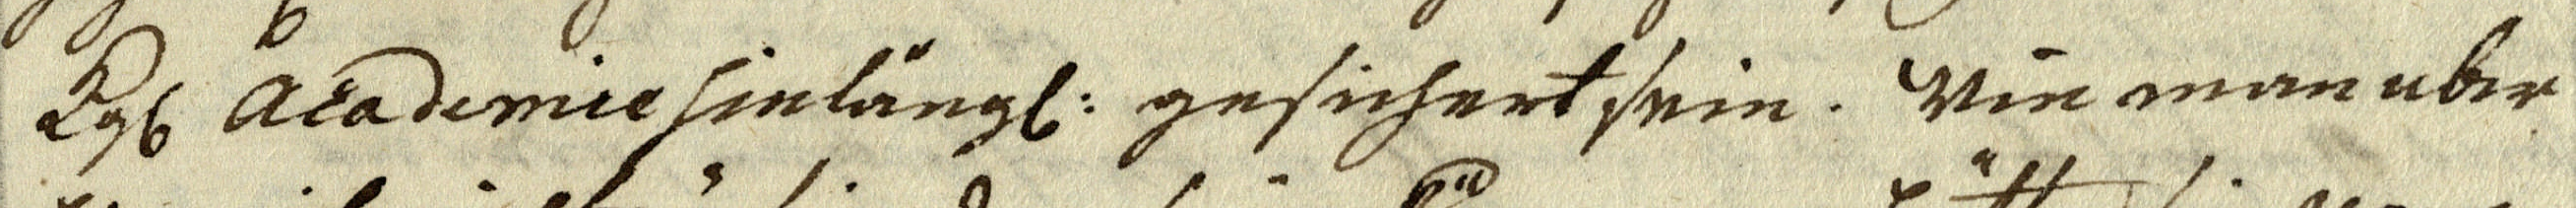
Kgl. Academie hinlängl. gesichert sein. Wie man aber
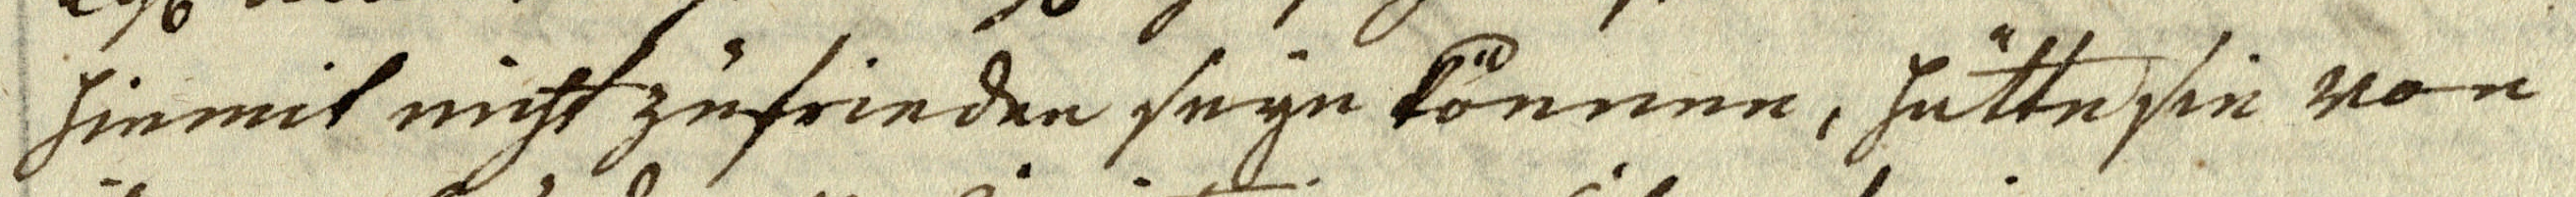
hiemit nicht zufrieden seÿn können, hätte sie von
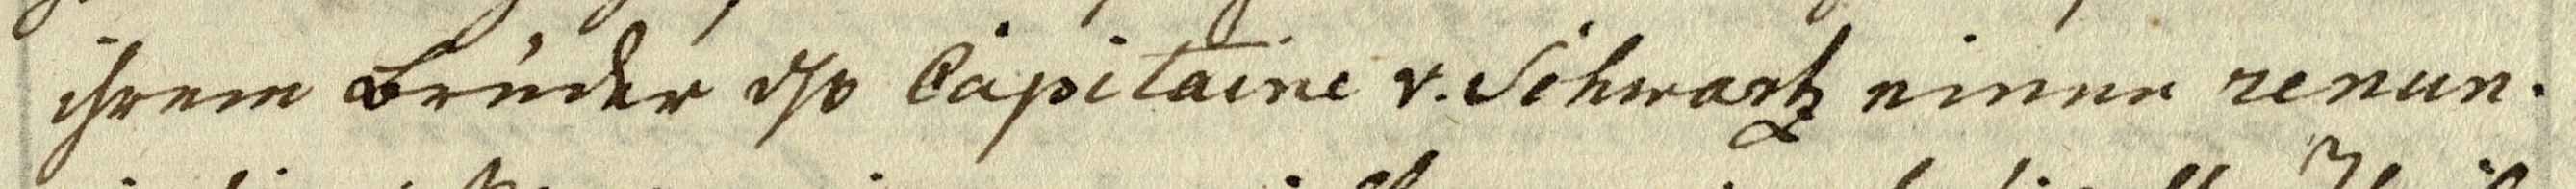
ihrem Bruder dh. Capitaine v. Schwartz einen renun¬
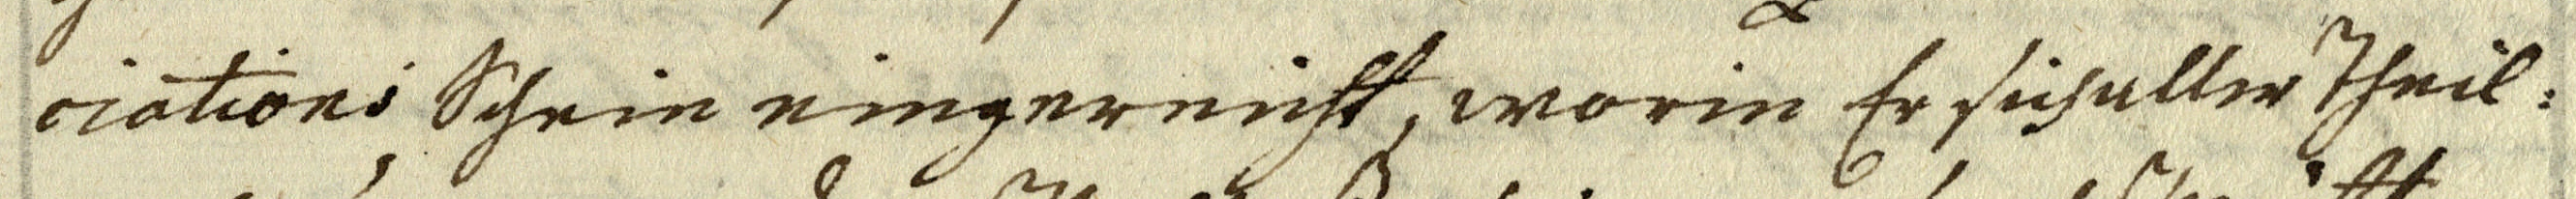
ciations Schein eigereicht, worin Er sich aller Theil¬
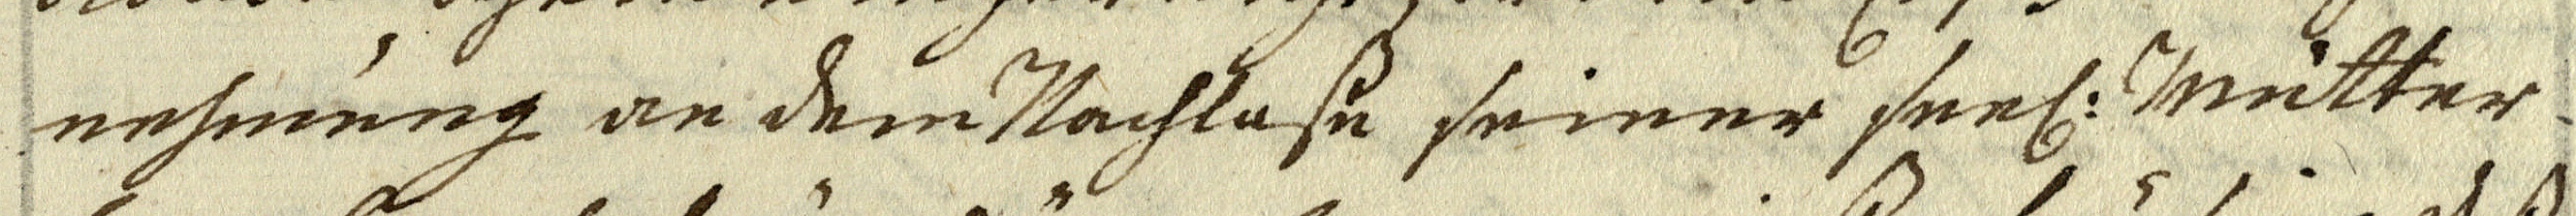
nehmung an dem Nachlaße seiner seel. Mutter
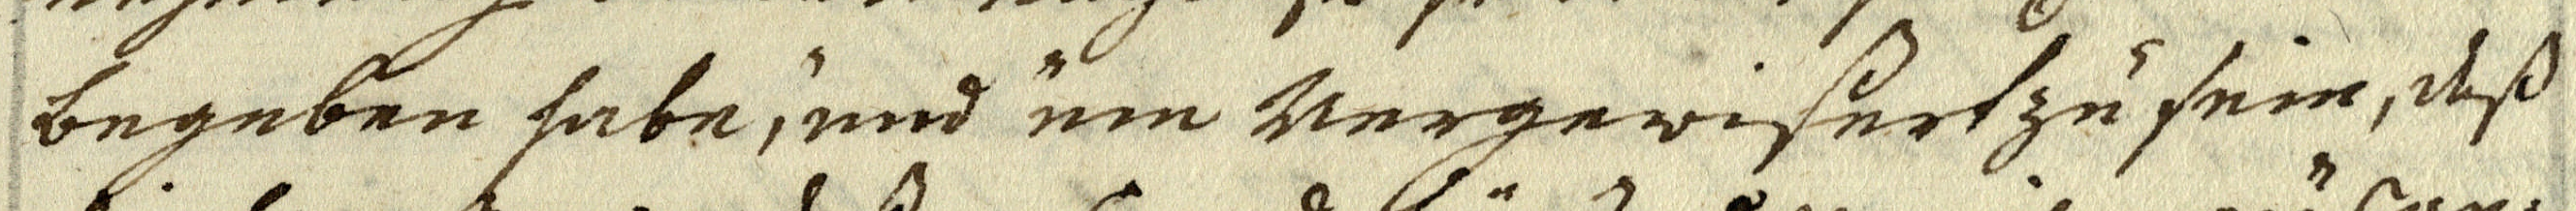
begeben habe, und um vergewißert zu sein, daß
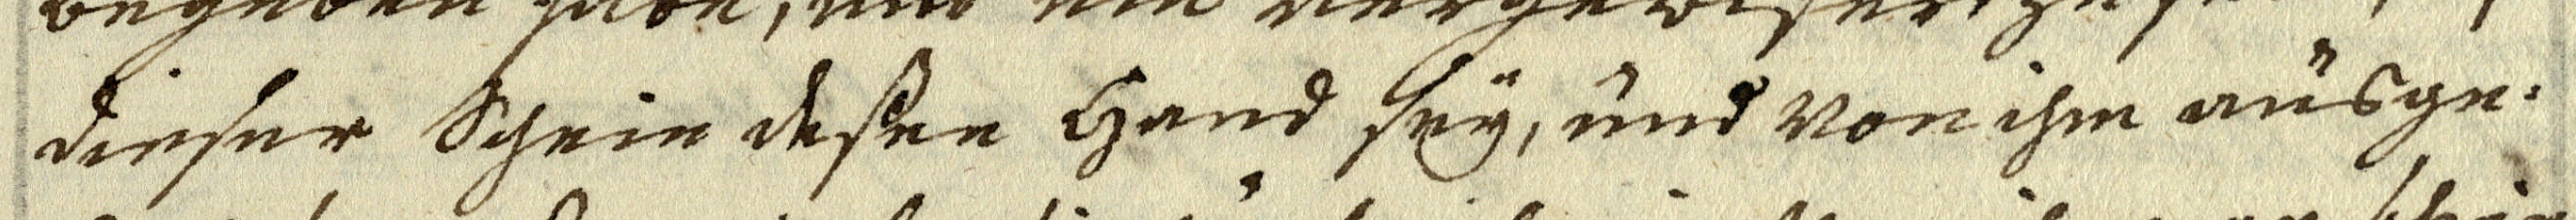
dieser Schein deßen Hand seÿ, und von ihm ausge¬
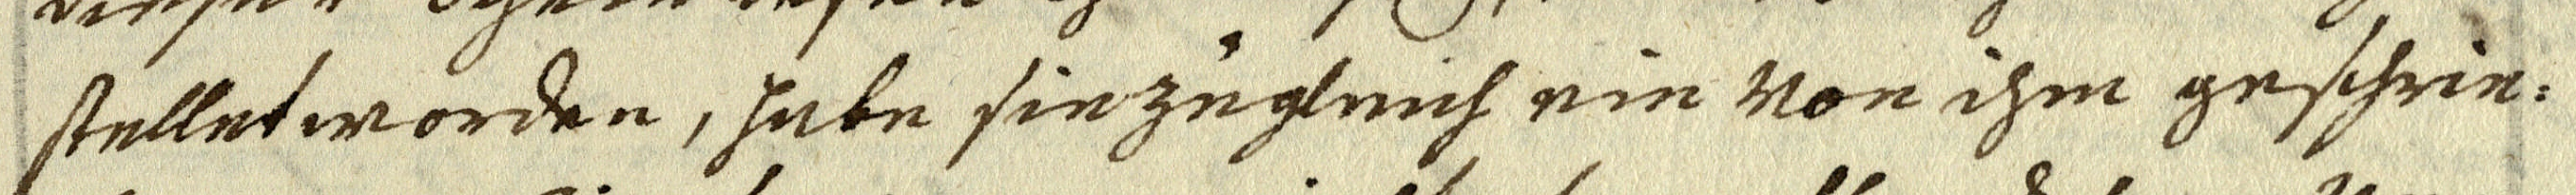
stellet worden, habe sie zugleich ein von ihm geschrie¬
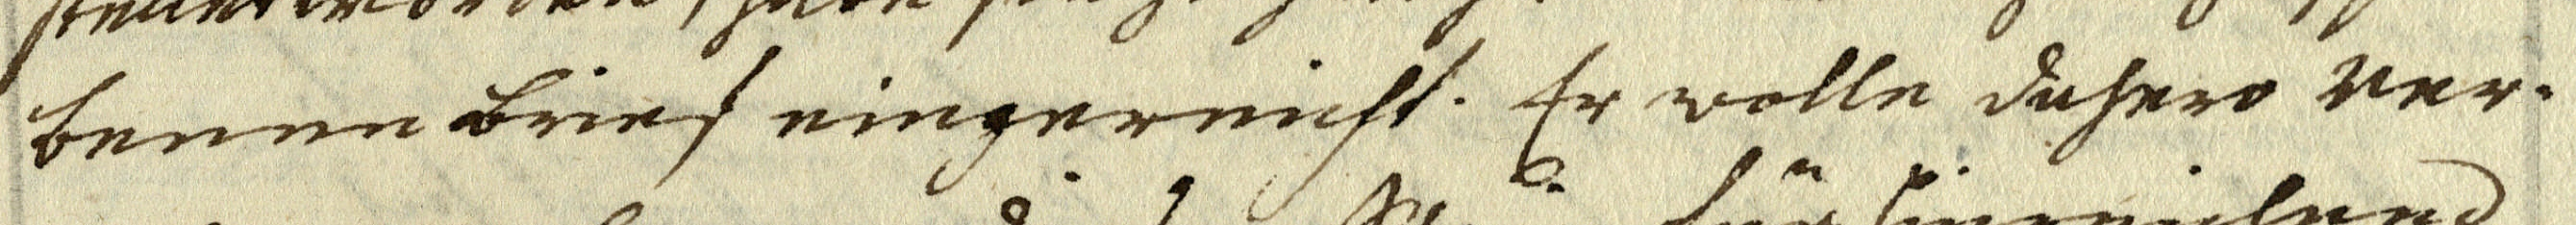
benen Brief eingereicht. Er wolle dahero ver¬
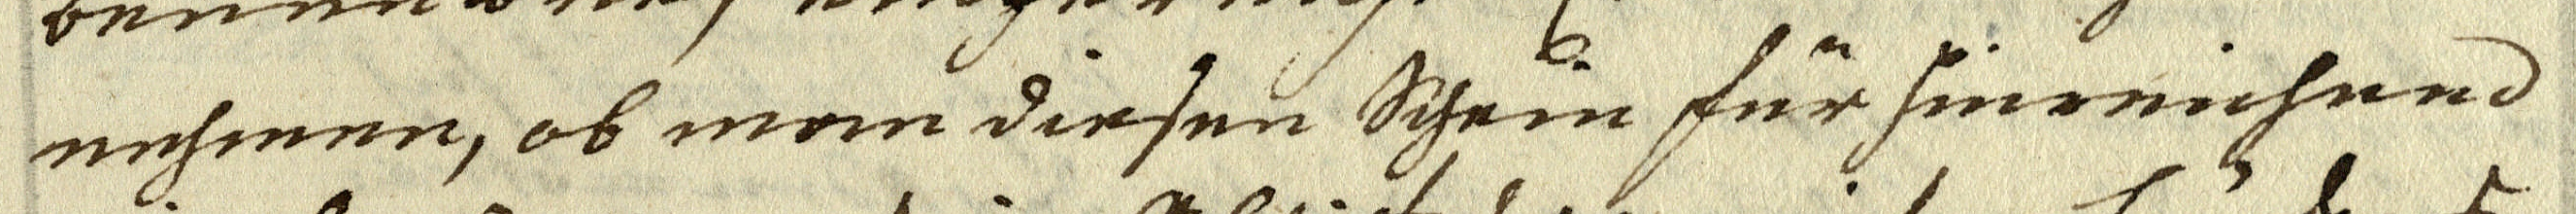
nehmen, ob man diesen Schein für hinreichend
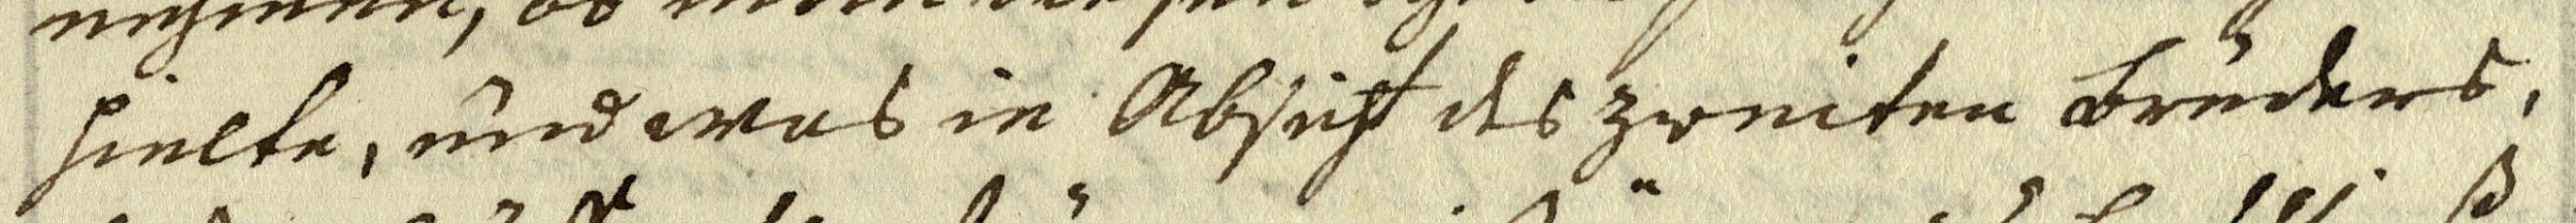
hielte, und was in Absicht des zweiten Bruders,
